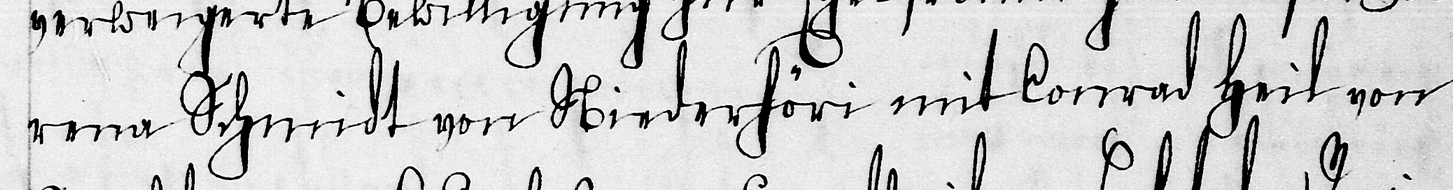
rena Schmidt von Niederhöri mit Conrad Heil von
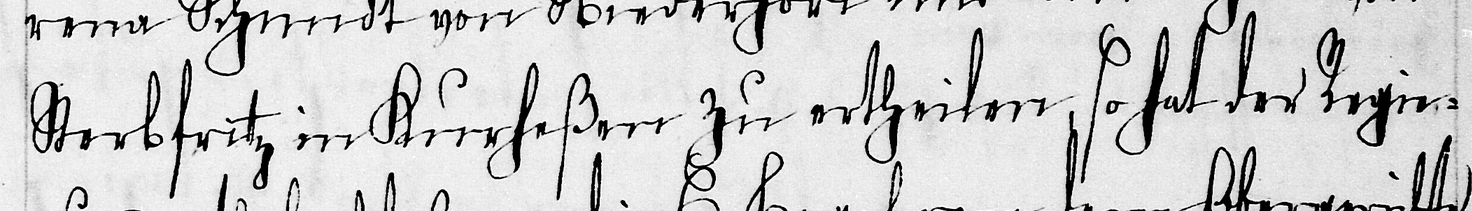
Sterbfritz in Kurheßen zu ertheilen, so hat der Regie¬
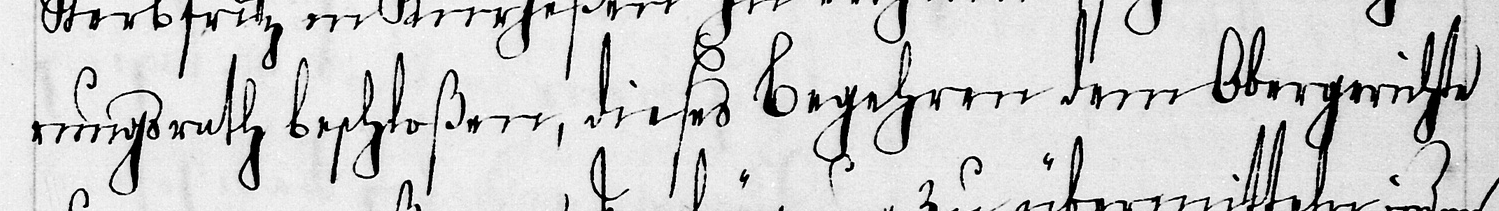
rungsrath beschloßen, diese Begehren dem Obergerichte
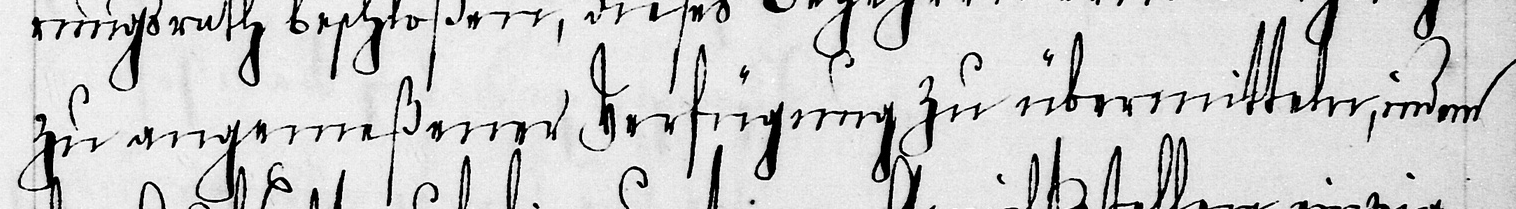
zu angemeßener Verfügung zu übermitteln, indem
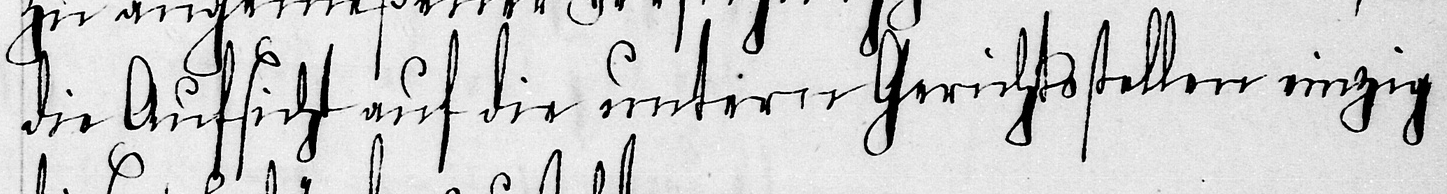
die Aufsicht auf die untern Gerichtsstellen einzig
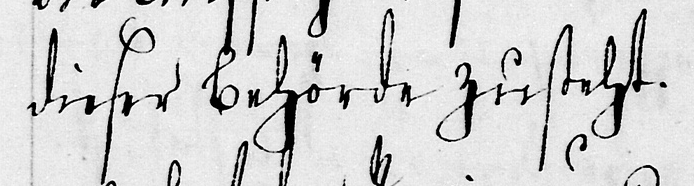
dieser Behörde zusteht.
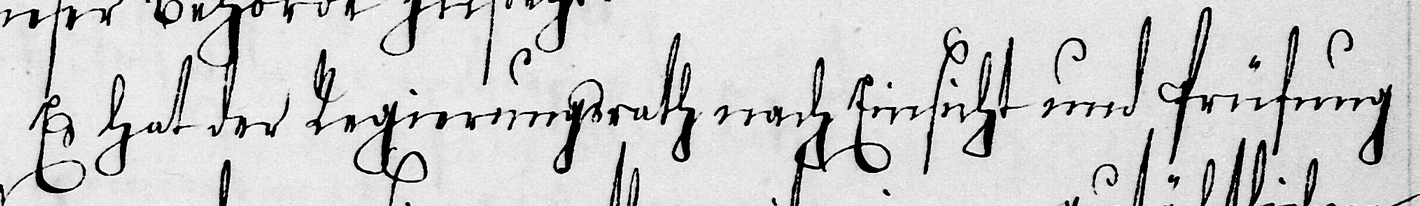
Es hat der Regierungsrath nach Einsicht und Prüfung
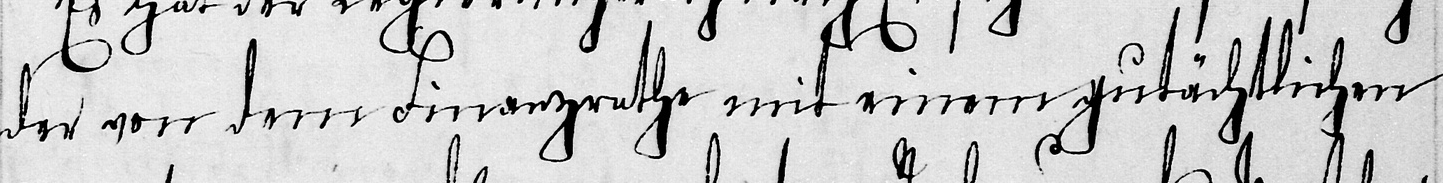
der von dem Finanzrathe mit einem gutächtlichen
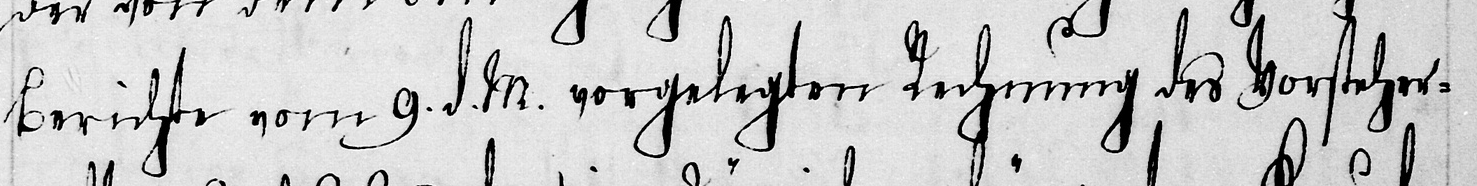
Berichte vom 9. d. M. vorgelegten Rechnung des Vorsteher¬
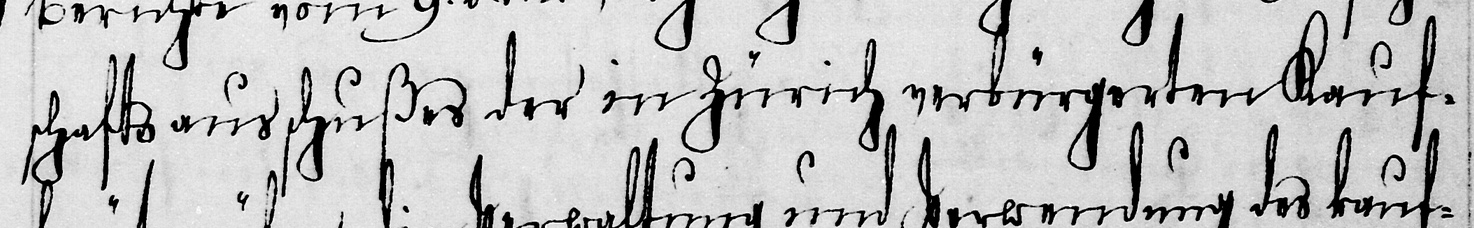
schaftsausschußes der in Zürich verbürgerten Kauf¬
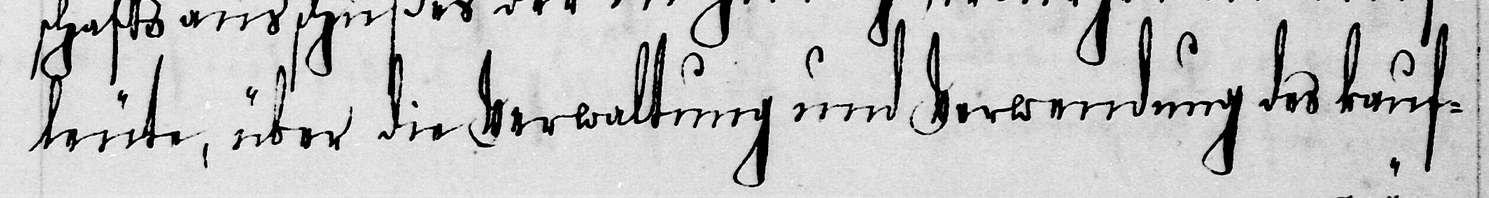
leute, über die Verwaltung und Verwendung des kauf-
